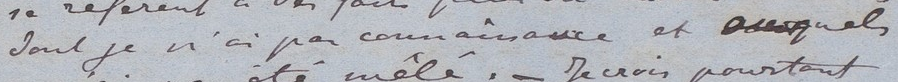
dont je n'ai pas connaissance et auxquels
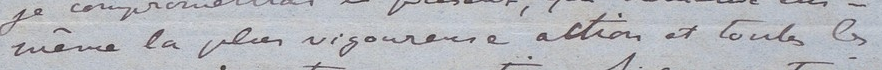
même la plus vigoureuse action et toutes les
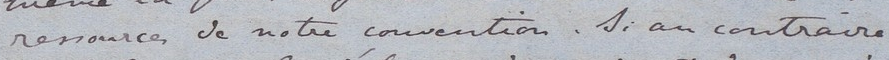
ressources de notre convention. Si au contraire
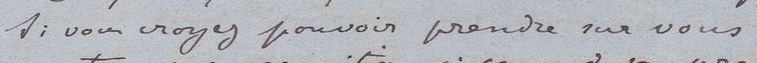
Si vous croyez pouvoir prendre sur vous
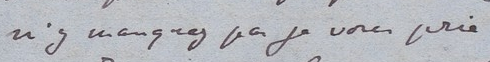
n'y manquez pas je vous prie.
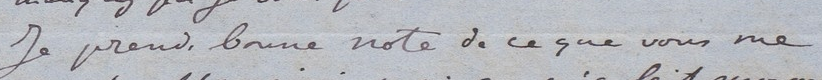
Je prends bonne note de ce que vous me
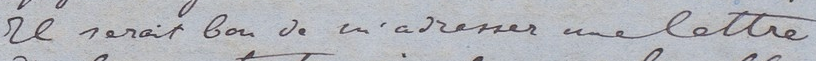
Il serait bon de m'adresser une lettre
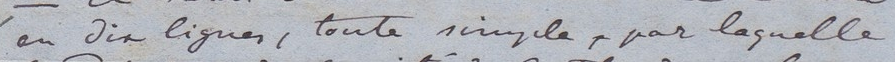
en dix lignes, toute simple, par laquelle
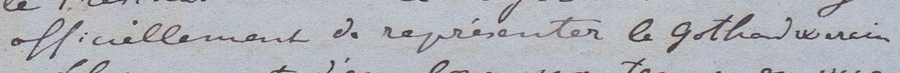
officiellement de représenter le Gothardverein
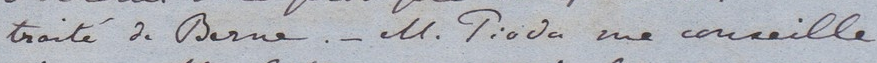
traité de Berne. – M. Pioda me conseille
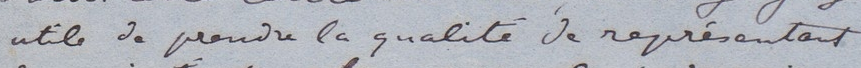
utile de prendre la qualité de représentant
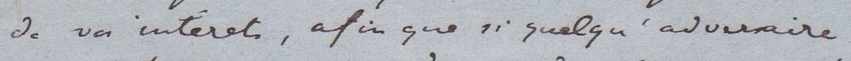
de vos intérets, afin que si quelqu'adversaire
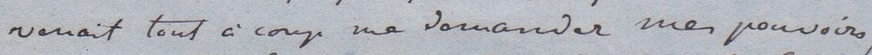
venait tout à coup me demander mes pouvoirs,
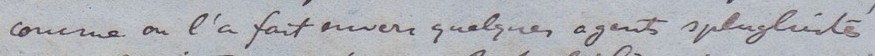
comme on l'a fait envers quelques agents splughistes
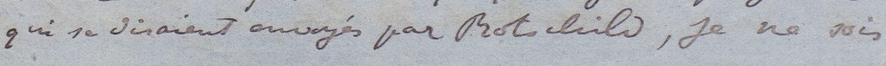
qui se disaient envoyés par Rotschild, je ne sois
